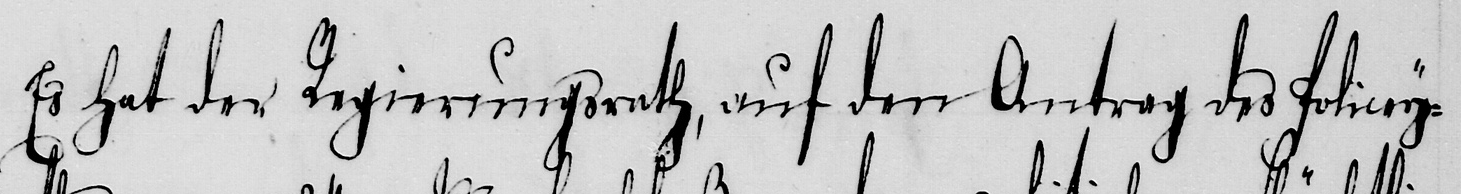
Es hat der Regierungsrath, auf den Antrag des Police¬
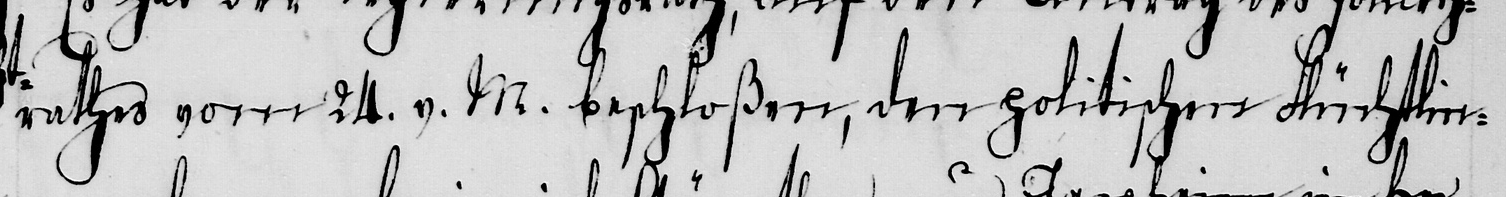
yrathes vom 24. v. M. beschloßen, den politischen Flüchtlin¬
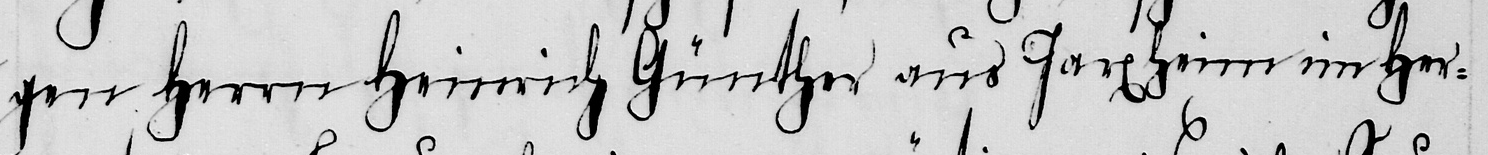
gen Herrn Heinrich Günther aus Jarxheim im Her¬
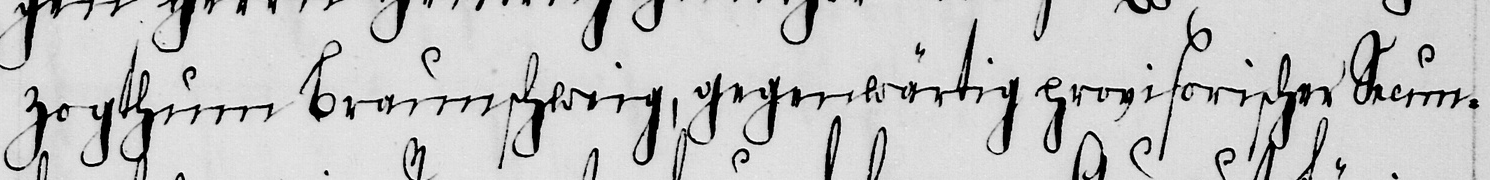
zogthum Braunschweig, gegenwärtig provisorischer Secun¬
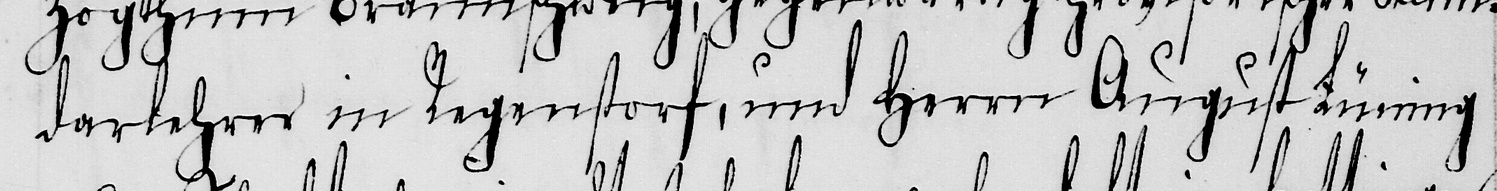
darlehrer in Regenstorf, und Herrn August Lüning
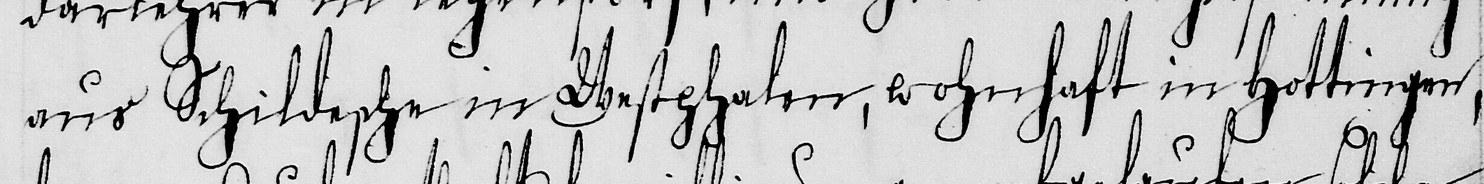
aus Schildesche in Westphalen, wohnhaft in Hottingen,
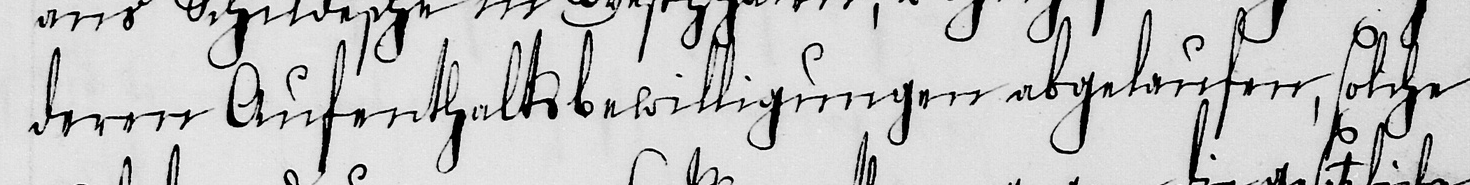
deren Aufenthaltsbewilligungen abgelaufen, solche
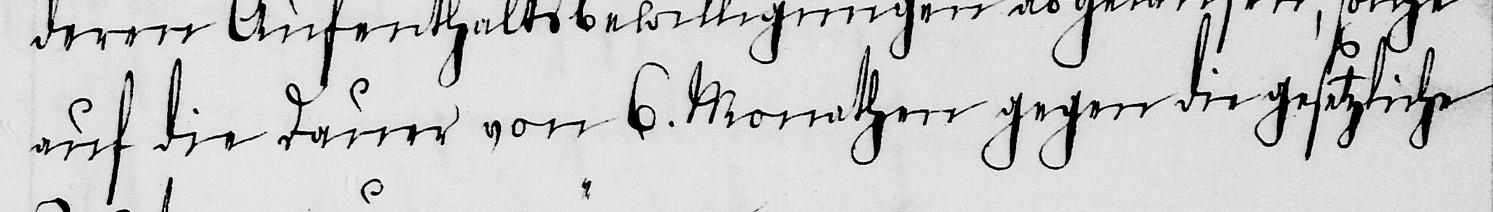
auf die Dauer von 6. Monathen gegen die gesetzliche
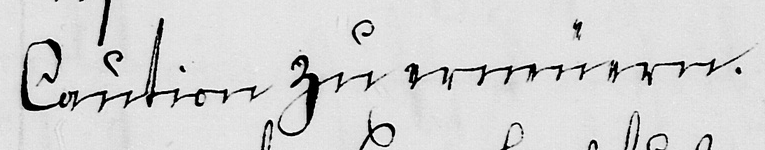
Caution zu erneuern.
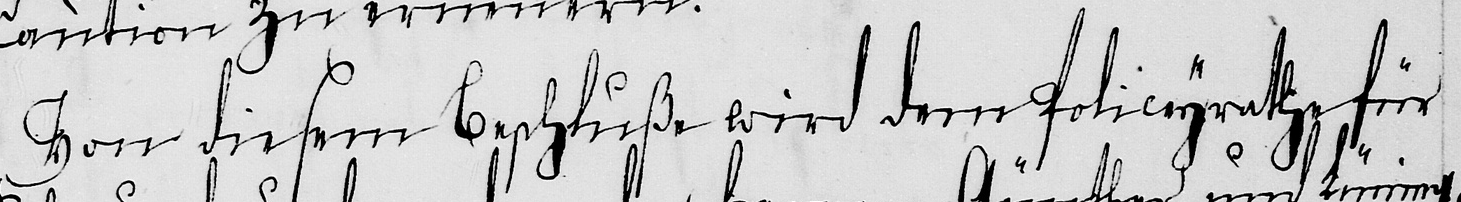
Von hiesigem Beschluße wird dem Policeyrathe für
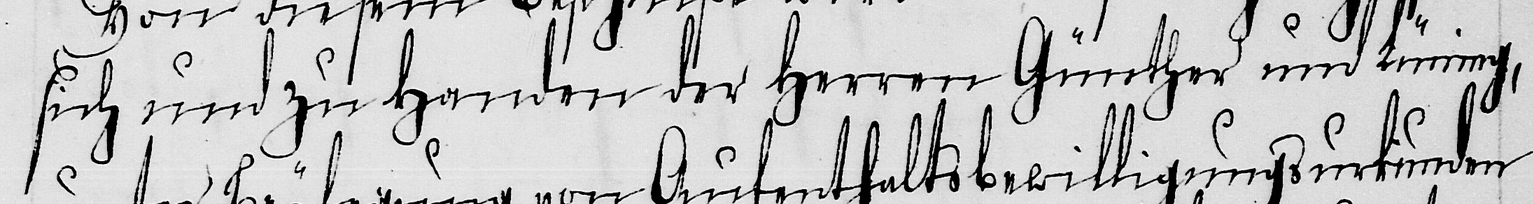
sich und zu Handen der Herren Günther und Lüning,
